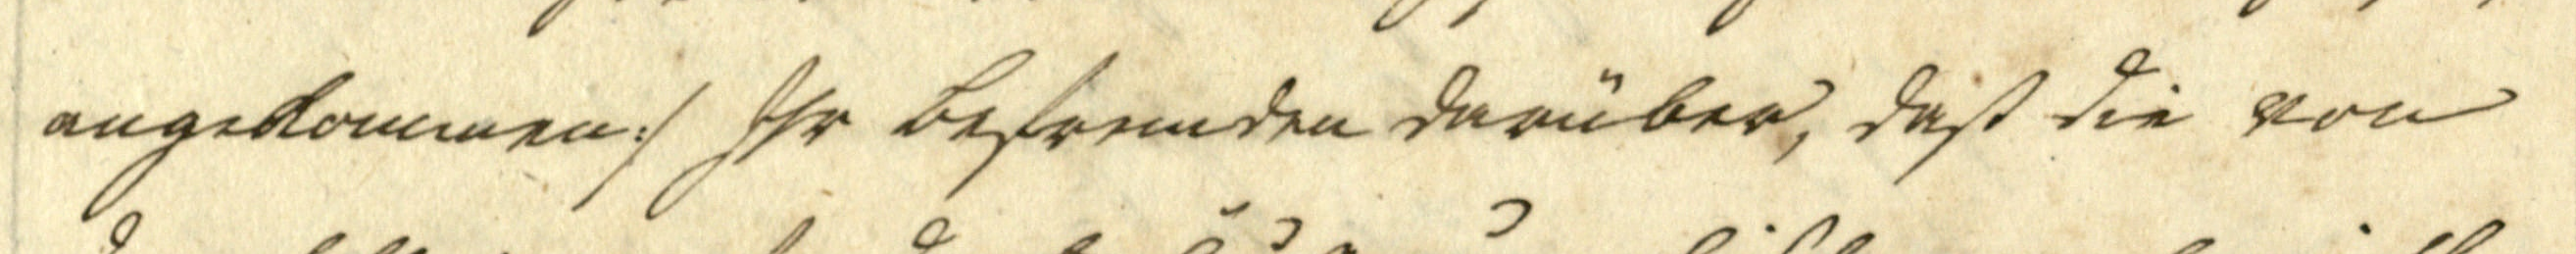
angekommen :/ Ihr Befremden darüber, daß die von
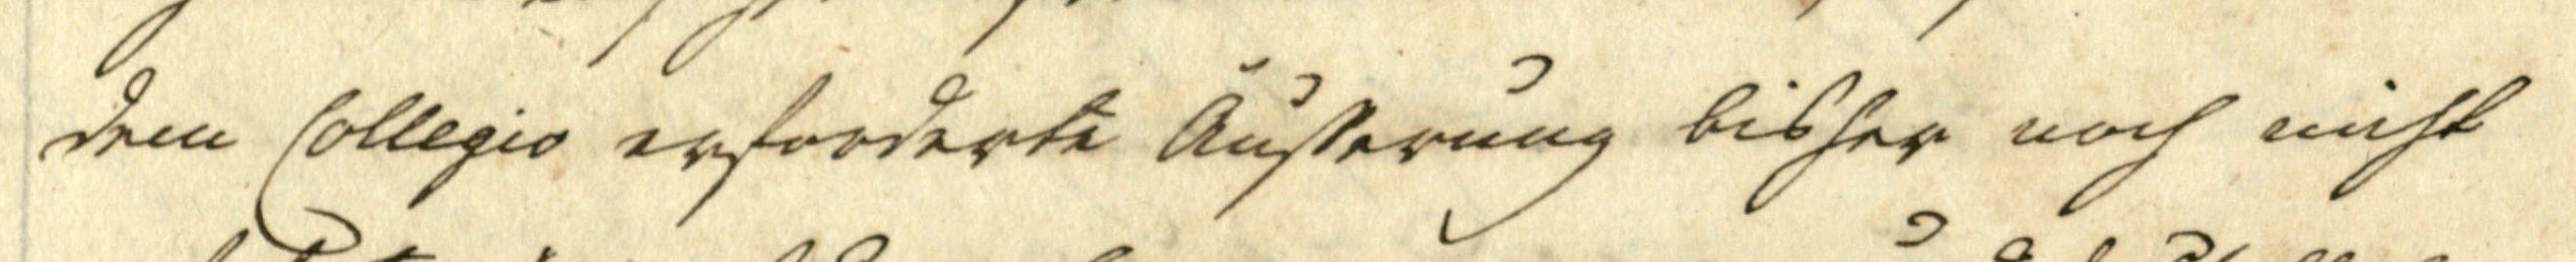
dem Collegio erforderte Äusserung bisher noch nicht
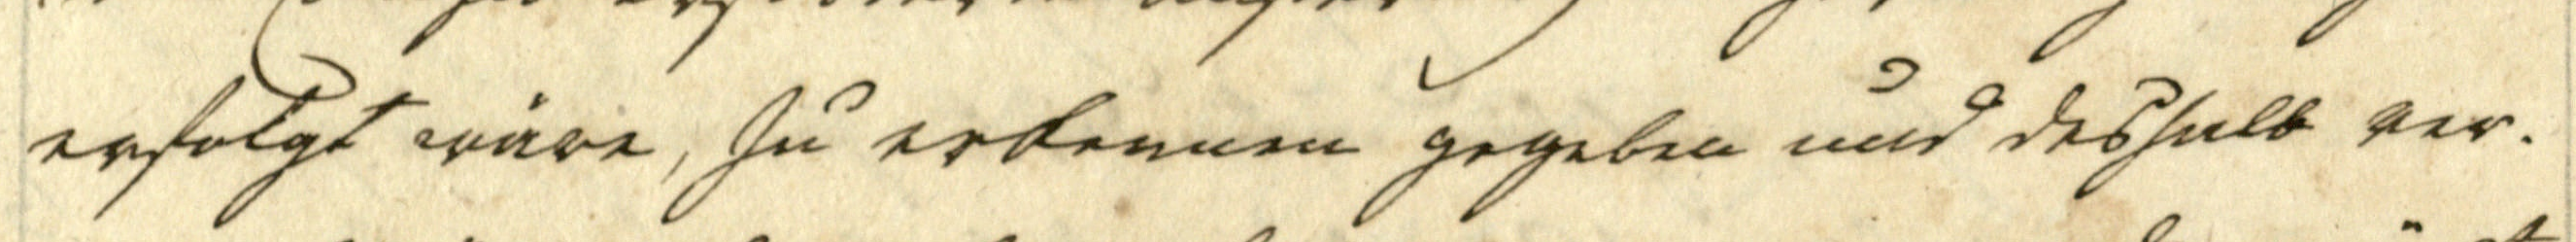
erfolgt wäre, zu erkennen gegeben und deshalb ver¬
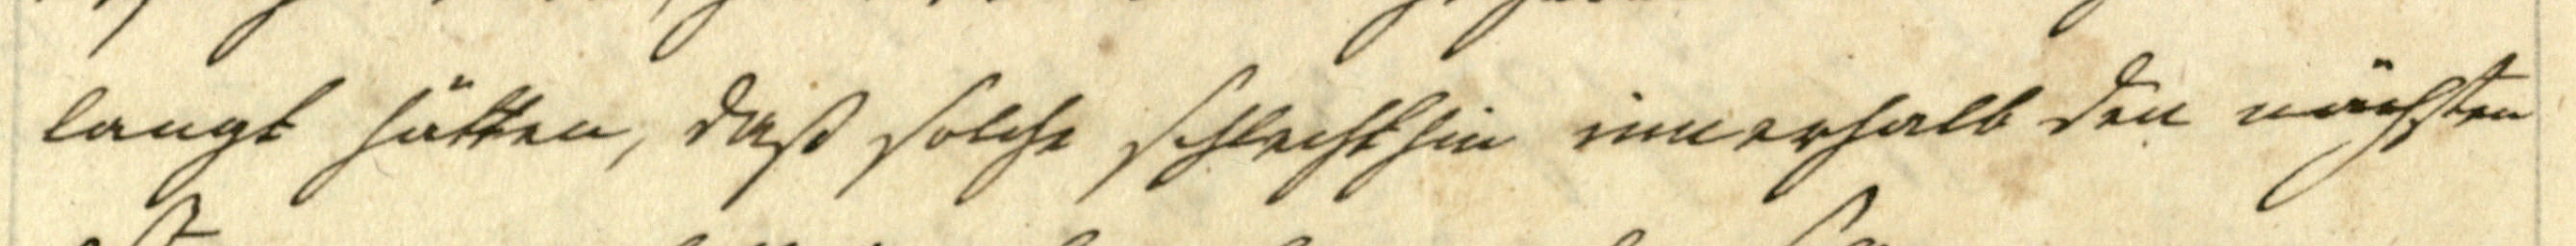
langt hätten, daß solche schlechthin innerhalb den nächsten
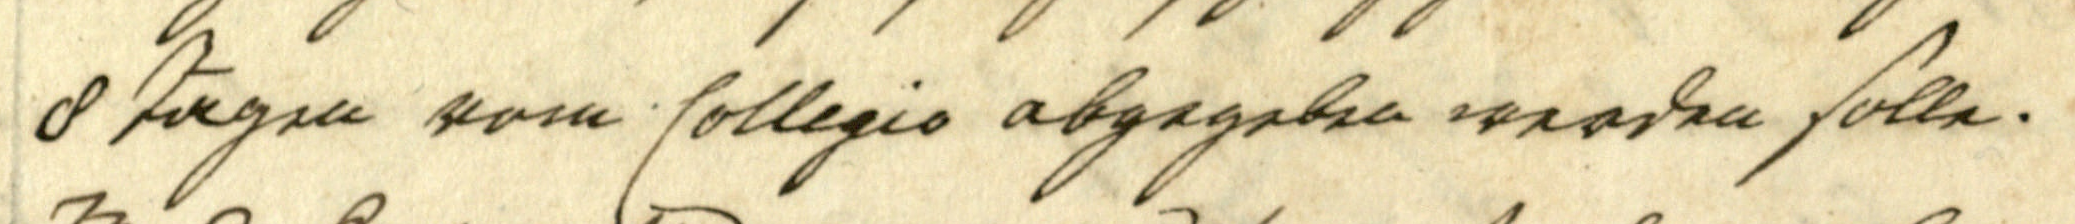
8 Tagen vom Collegio abgegeben werden solle.
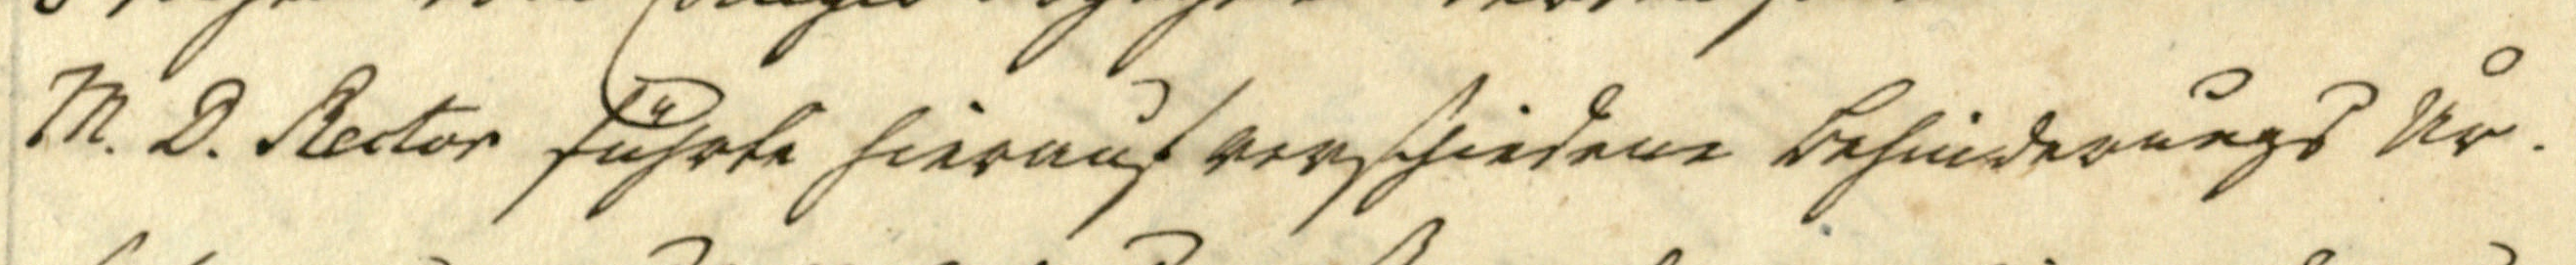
M. D. Rector führte hierauf verschiedene Behinderungs Ur¬
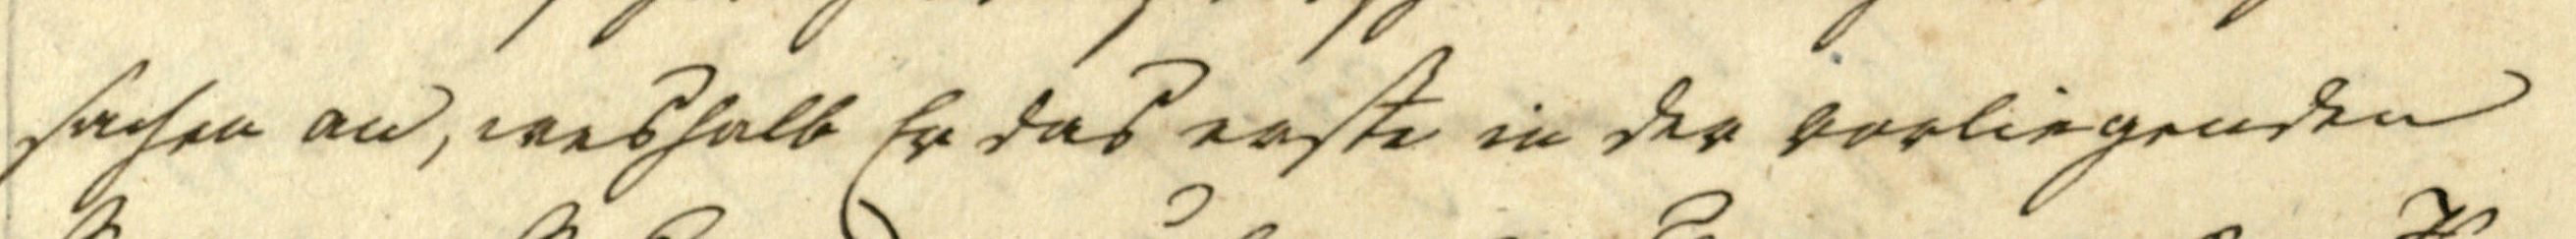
sachen an, weshalb Er das erste in der vorliegenden
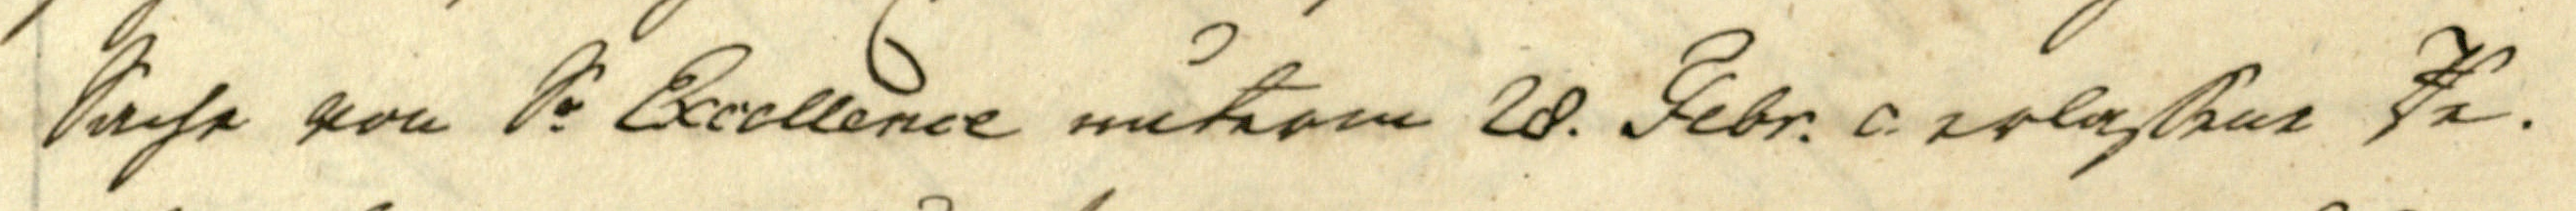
Sache von Sr Excellence unterm 28. Febr. c. erlassene Re¬
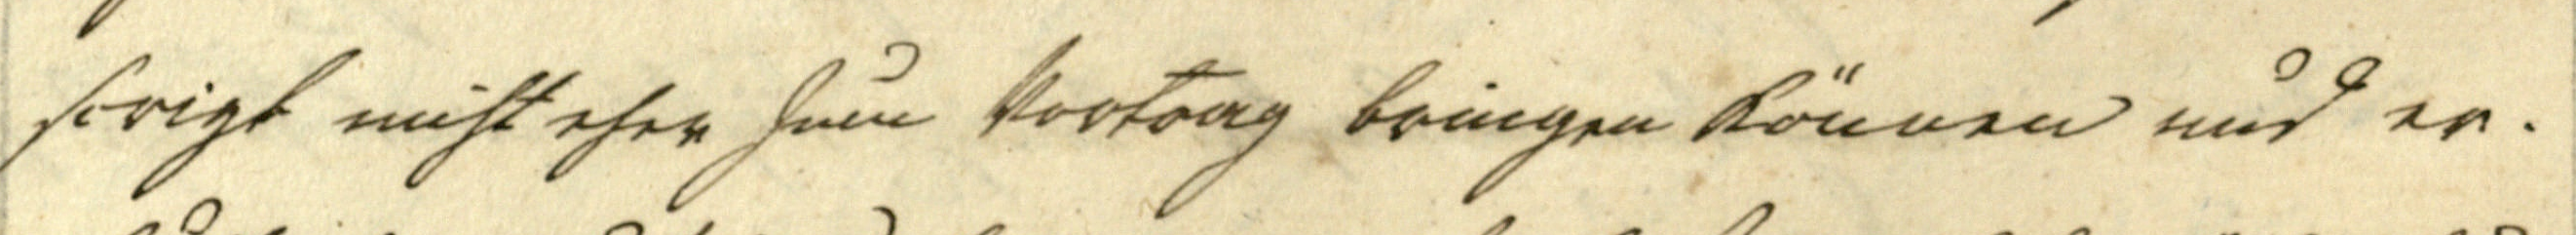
script nicht eher zum Vortrag bringen können und er¬
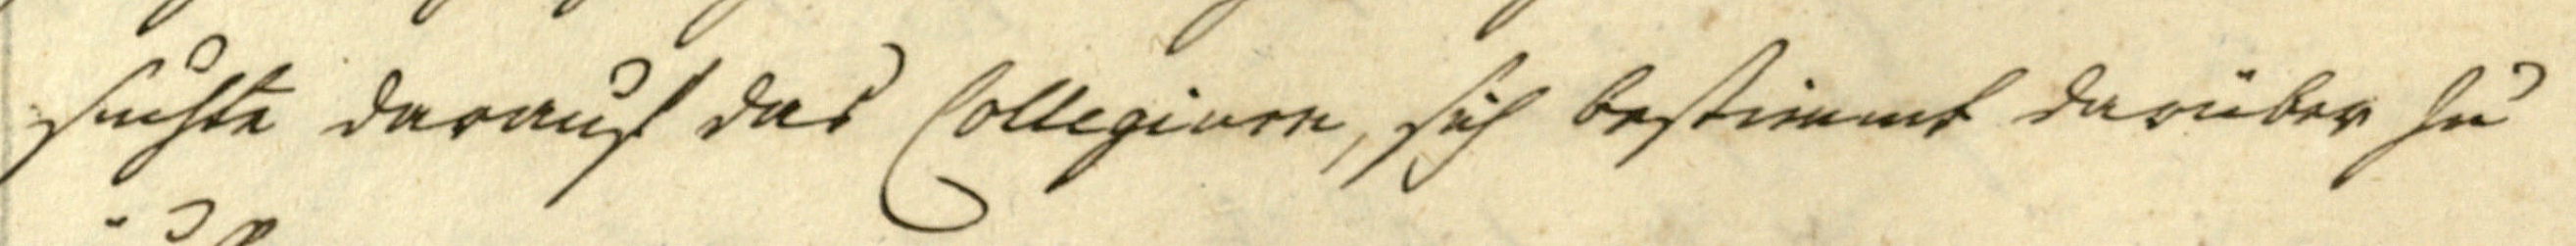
suchte darauf das Collegium, sich bestimmt darüber zu
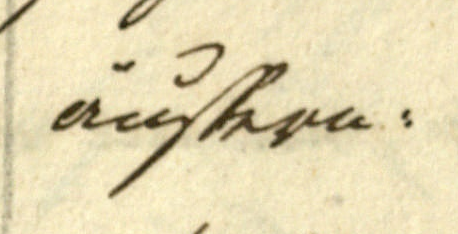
äussern:
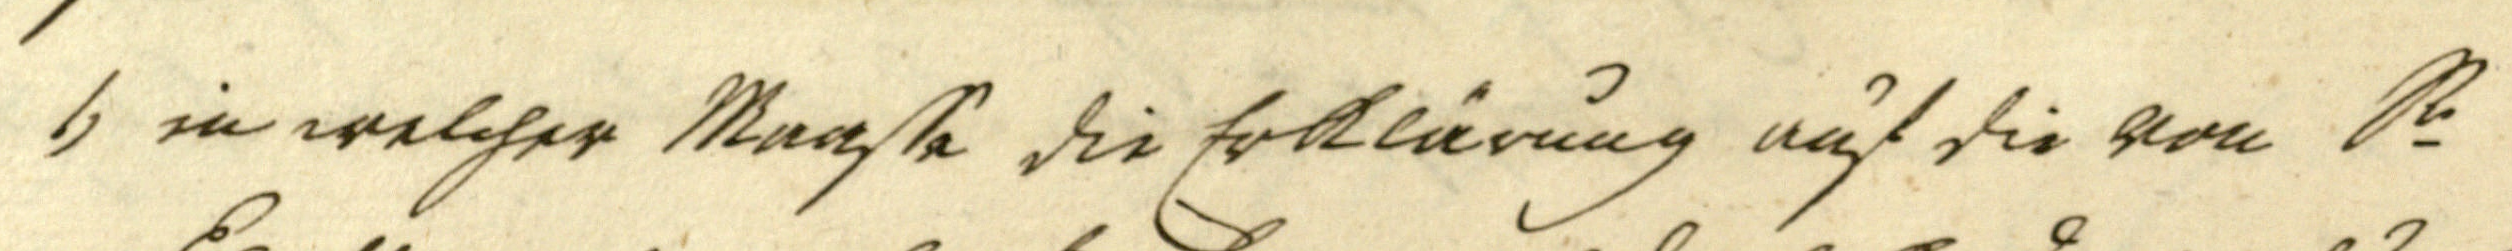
1, in welcher Maasse die Erklärung auf die von Sr
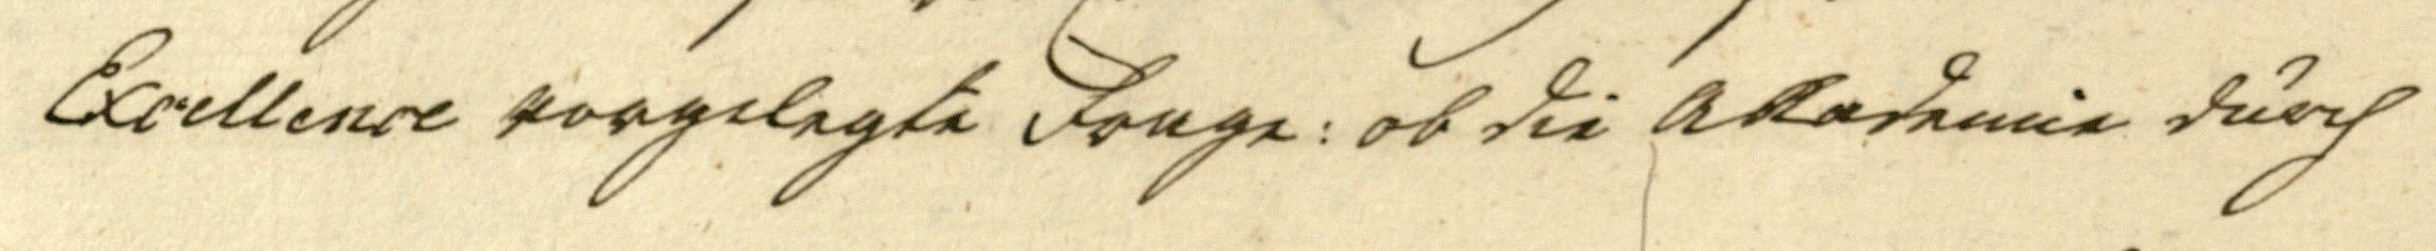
Excellence vorgelegte Frage: ob die Akademie durch
